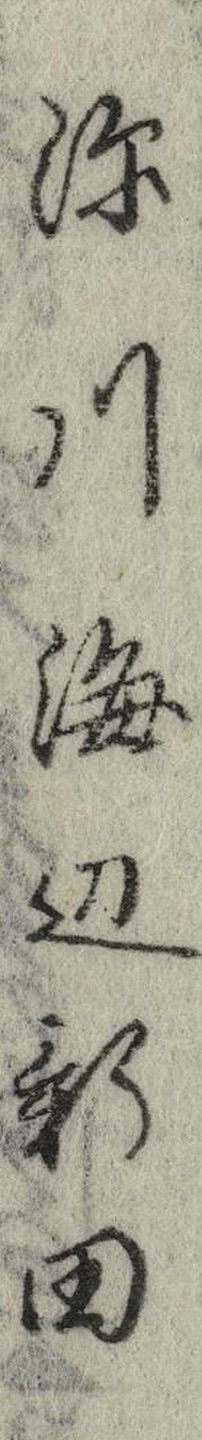深川海辺新田
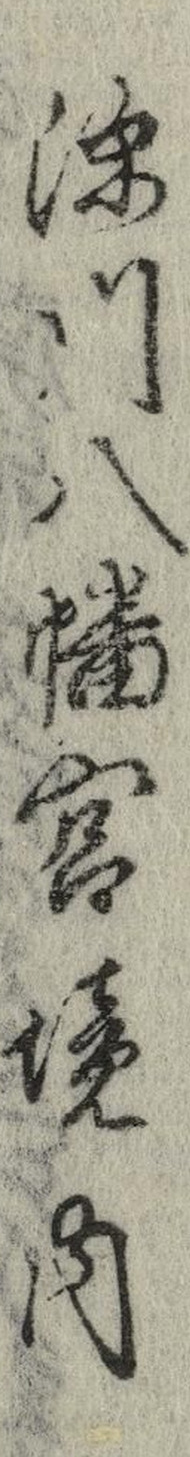深川八幡宮境内
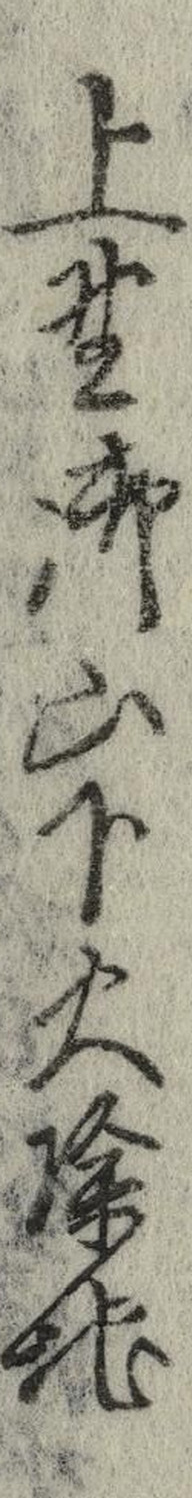上野御山下火除地
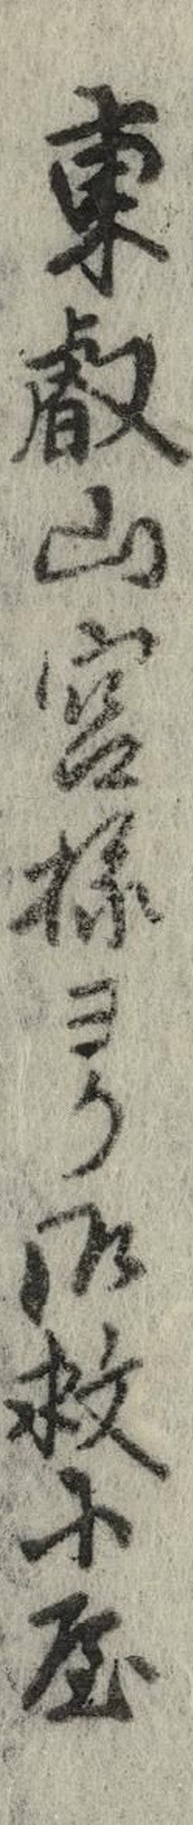東叡山宮様より御救小屋
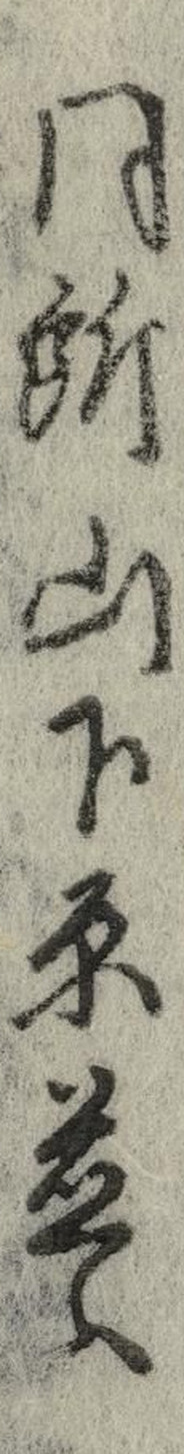同所山下原荒て候

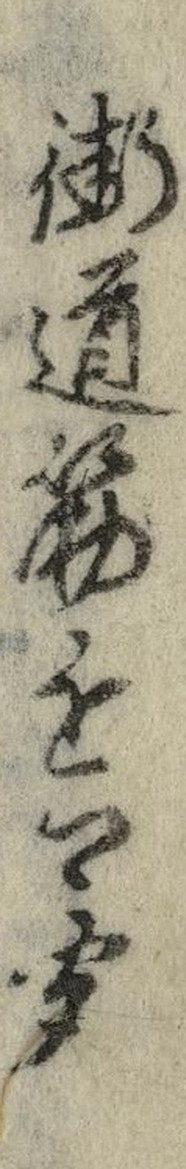街道筋近郷聞
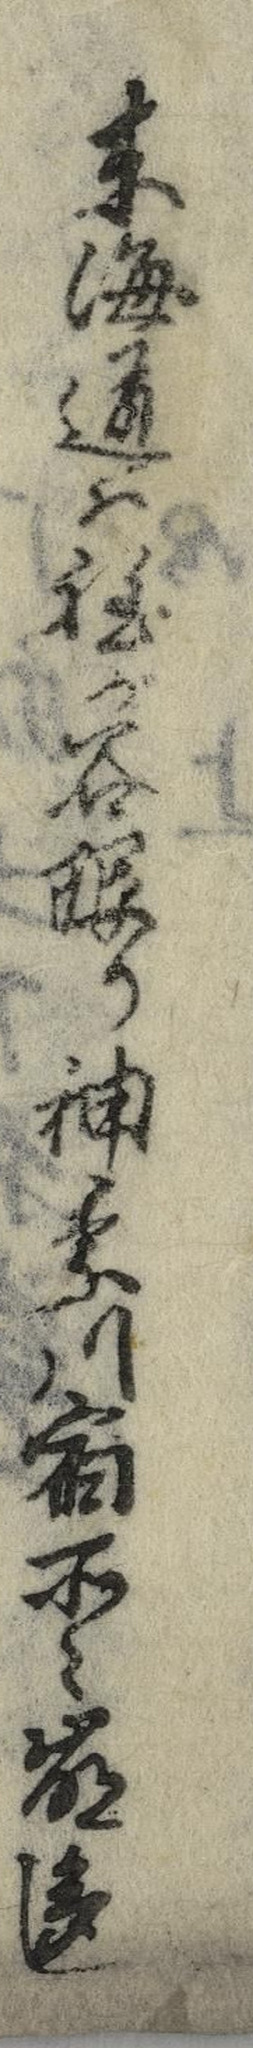東海道は程が谷限り神奈川宿所々崩多し
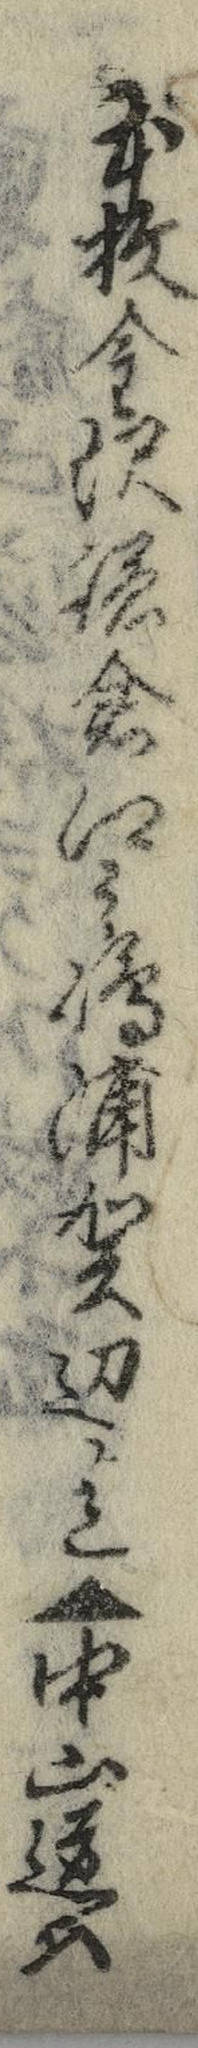本牧金沢鎌倉江の島浦賀辺迄▲中山道は
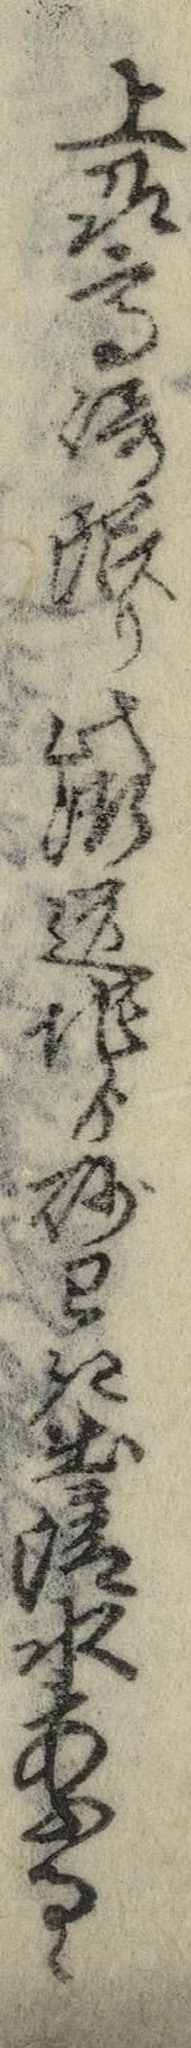上州高崎限り此街道地ゟ砂わき出清水あふるゝ
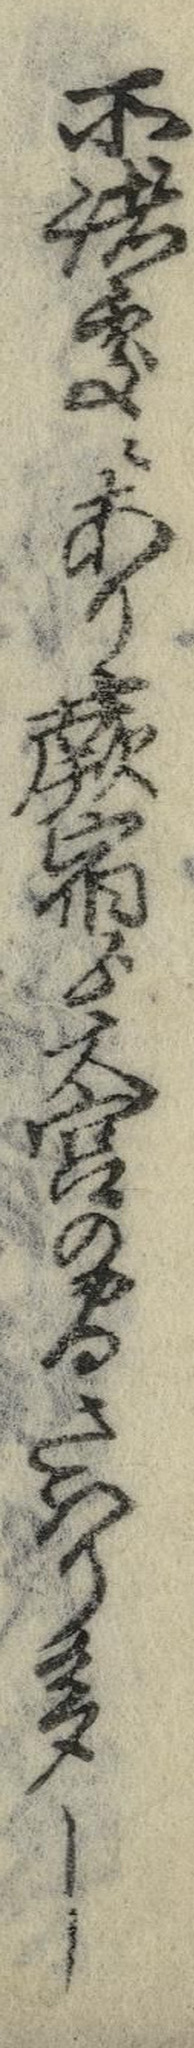所諸処にあり蕨宿ゟ大宮の間さわり多し
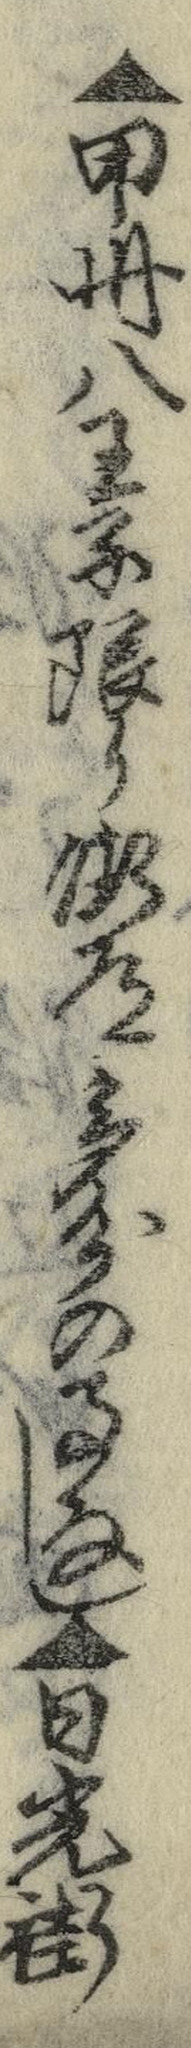▲甲州八王子限り街道多分の事なし▲日光街
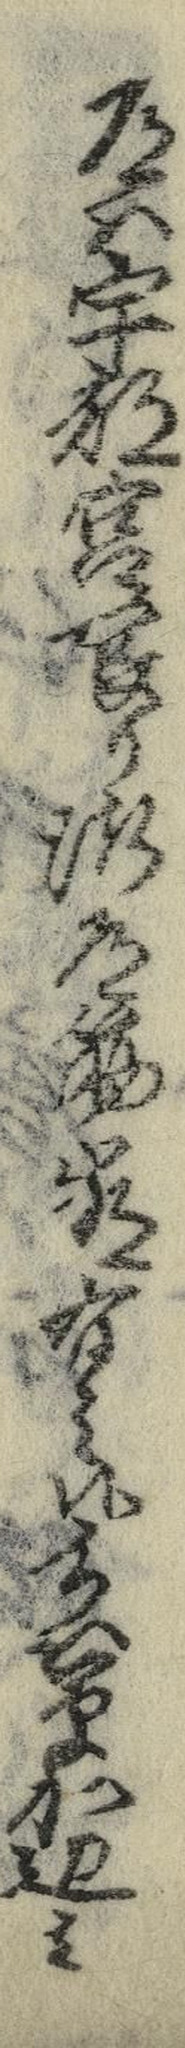道は宇都宮限り街道筋崩有之候またハ草加辺は
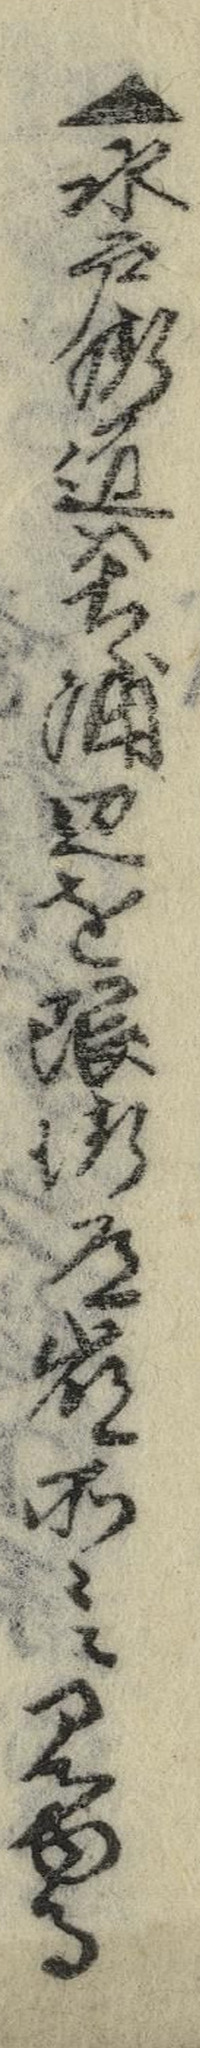▲水戸街道は土浦辺を限街道崩所々に見ゆる
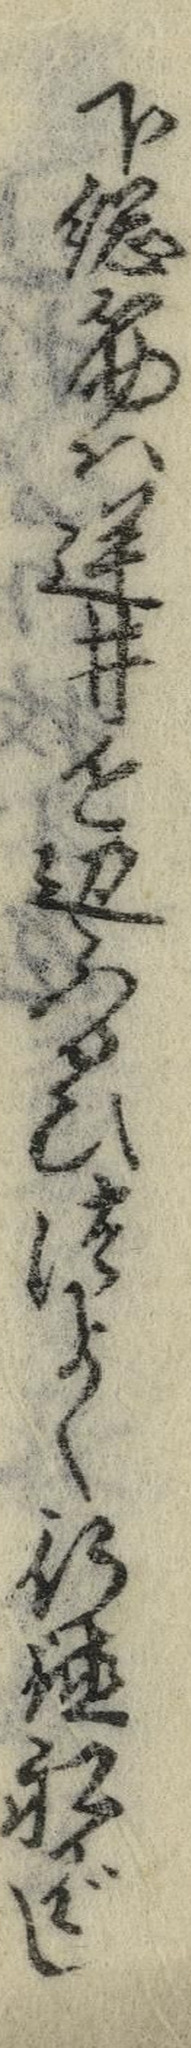下総筋は逆井近辺ふるひつよく行徳船ばし
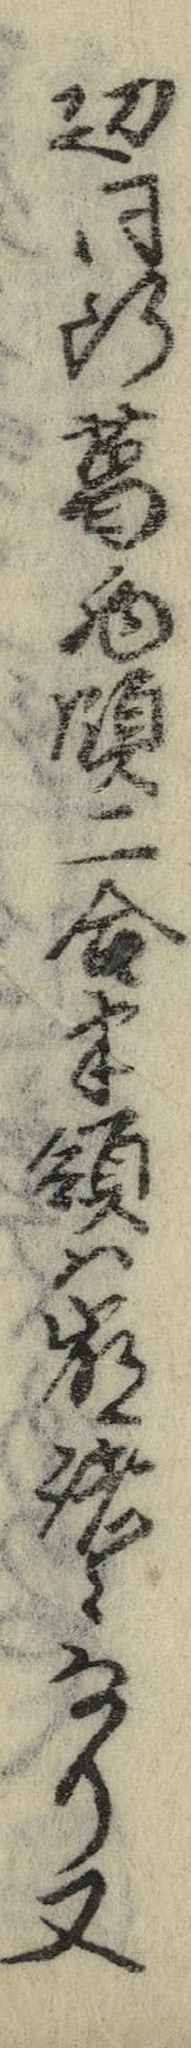辺同断葛西領二合半領は崩諸々なり又
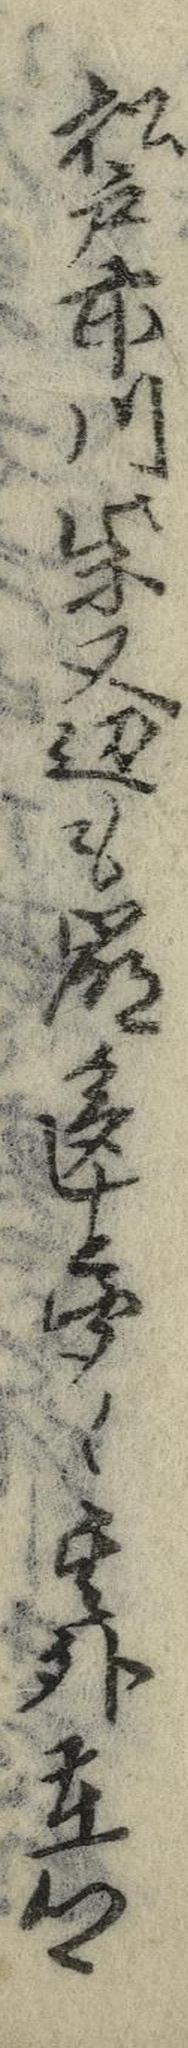松戸市川柴又辺も崩多しと聞く其外在郷
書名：地震類焼場所明細書之写　安政二卯年十月二日夜四ツ時過　御府内御屋敷方市中共、并街道筋近郷聞書
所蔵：東京大学地震研究所図書室 Earthquake Research Institute Library, The University of Tokyo, JAPAN
